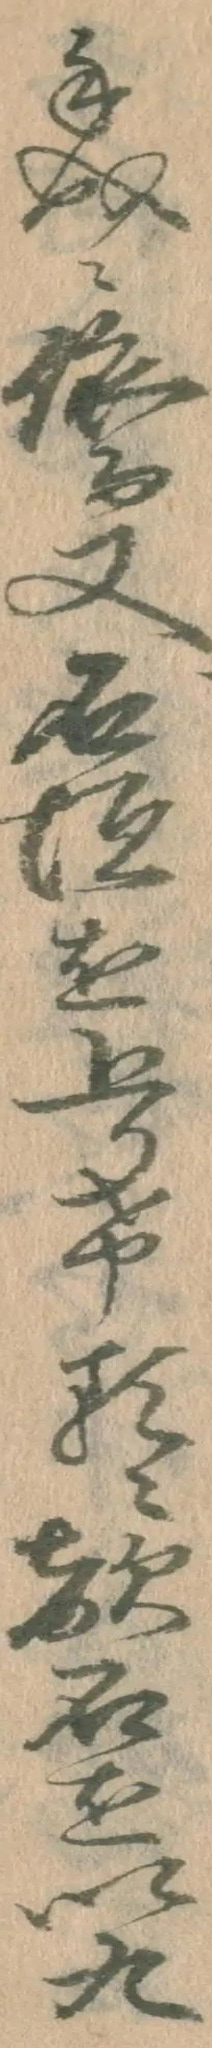手成に依而又石垣を上り希類に敵石を以九
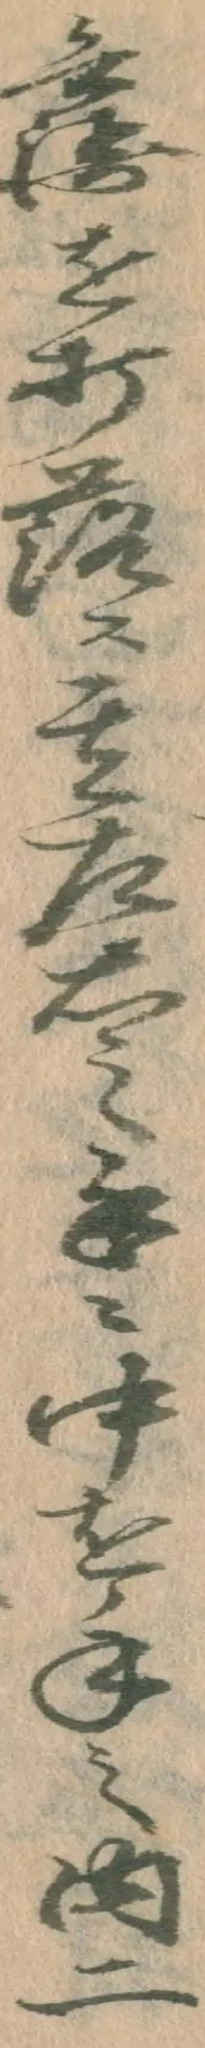兵衛を打落す其左右之手に中を手之内二
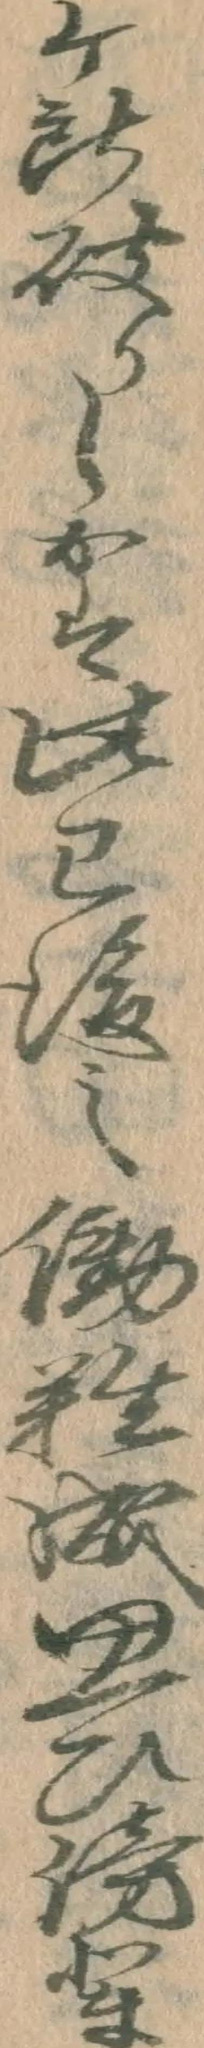け所破りしか盤此已後之働難成思ひ傍輩
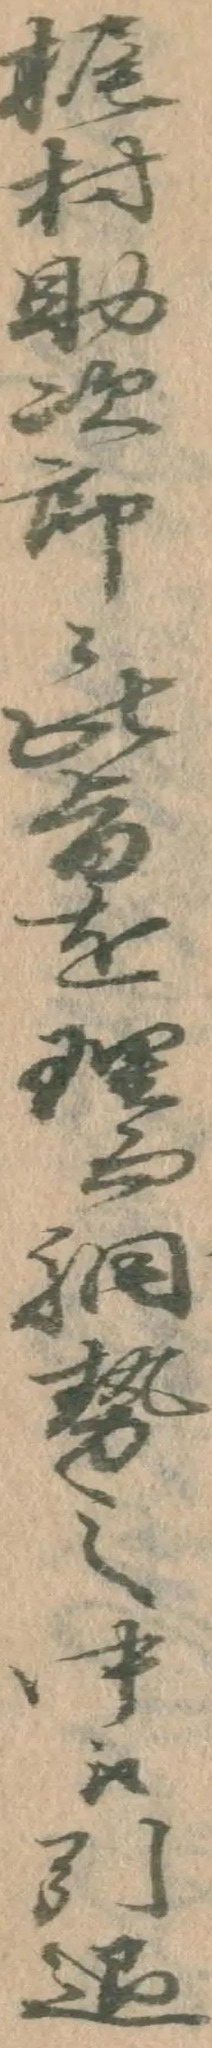梶村助次郎に此旨を理而稠勢之中江引退
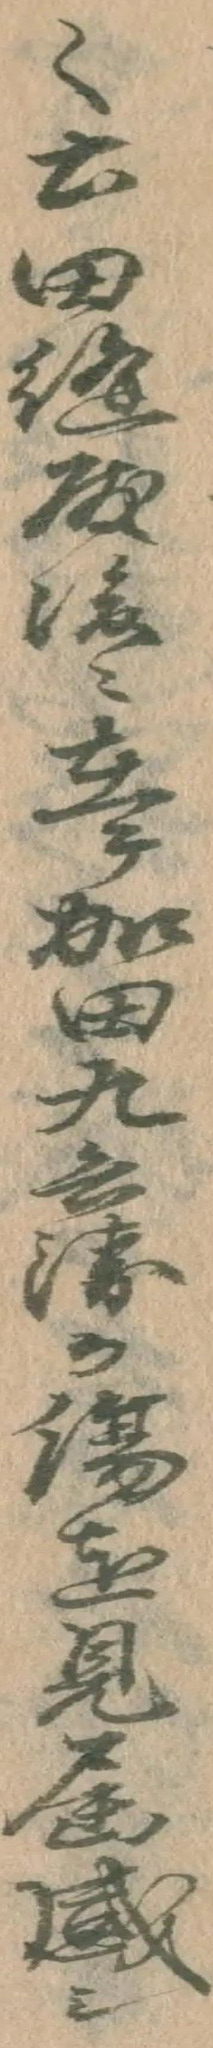く土田縫殿後に在て加田九兵衛か傷を見届感し
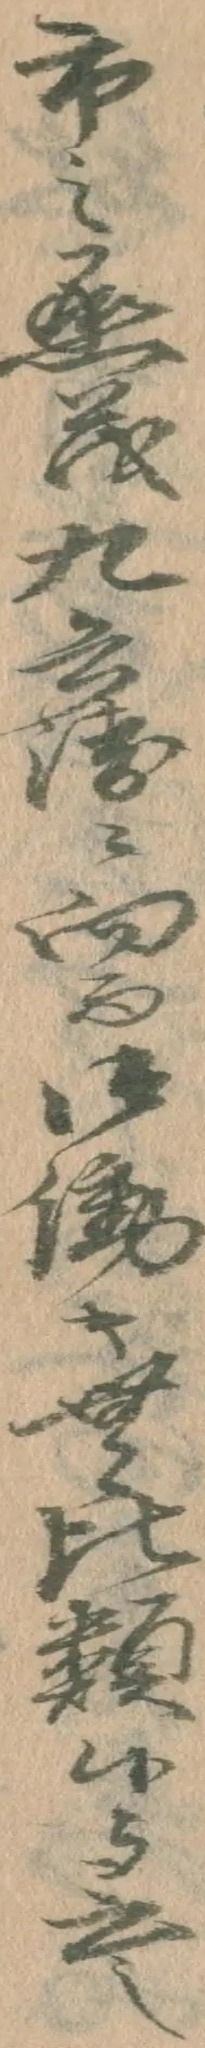市之丞茂九兵衛に向而御働き無比類候与云之
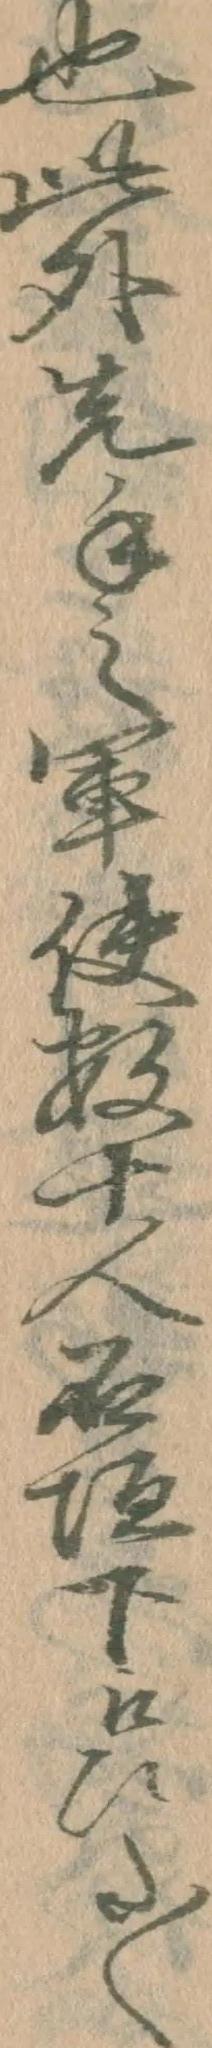也此外先手之軍使数十人石垣下江ひた〳〵
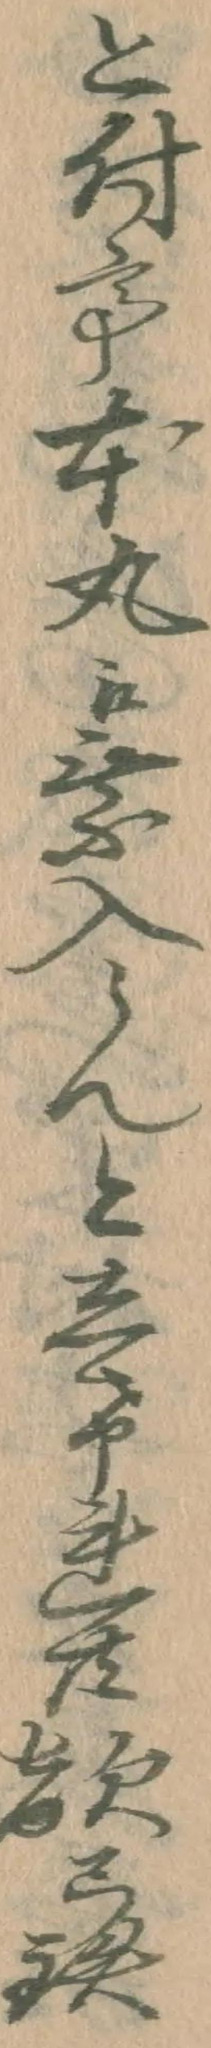と付亭本丸江乗入らんと志希連共敵弓鉄
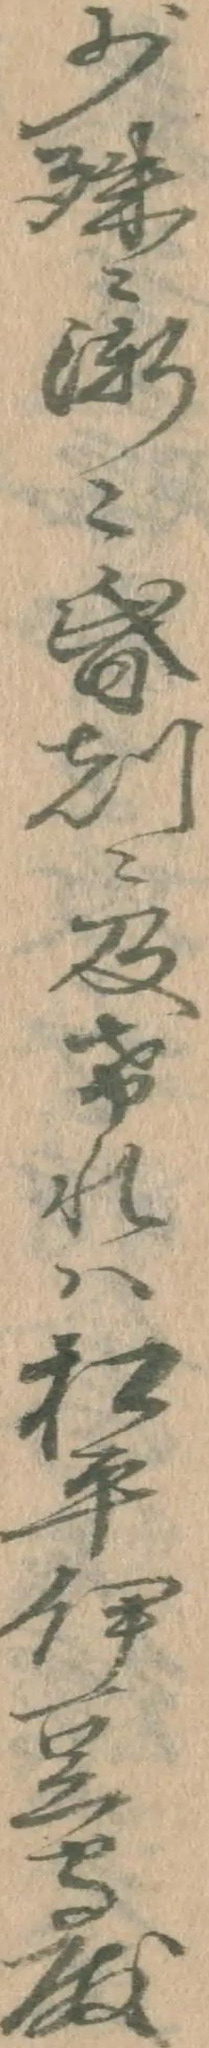少殊に漸々昏刻に及希れは松平伊豆守殿
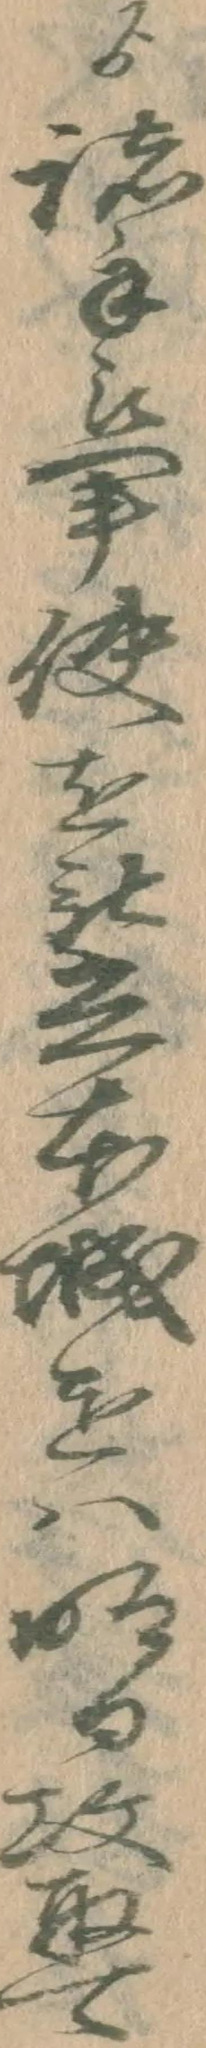ゟ諸手江軍使を被立本城をは明日攻取可
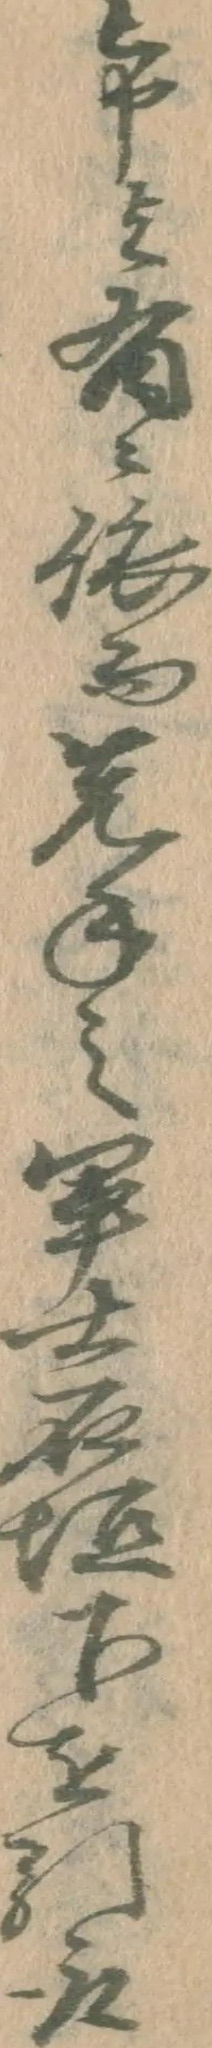被申与有に依而先手之軍士石垣下を引取
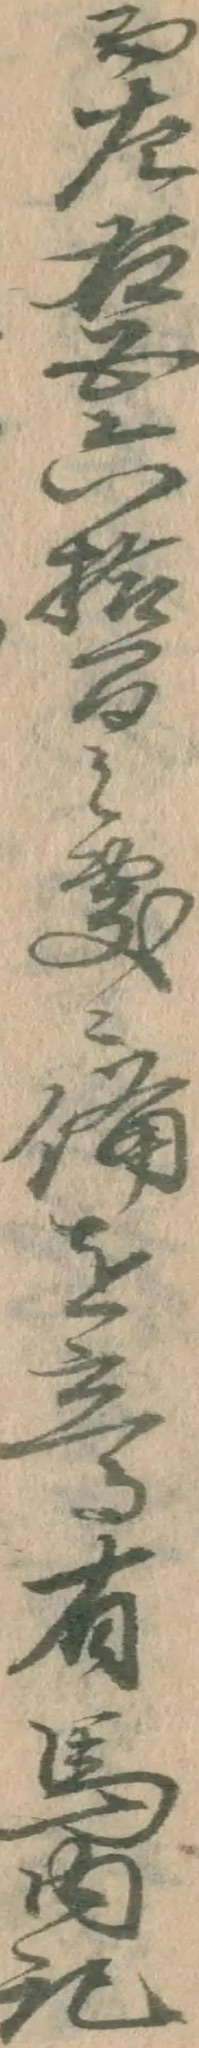而左右五六拾間之處に備を立る有馬内記
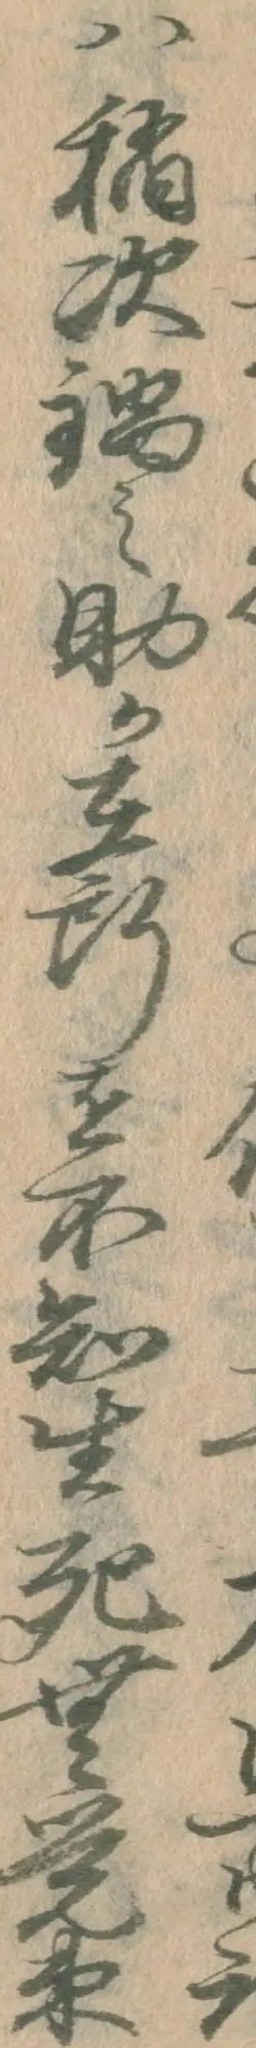は稲次鍋之助か在所を不知生死無覚束
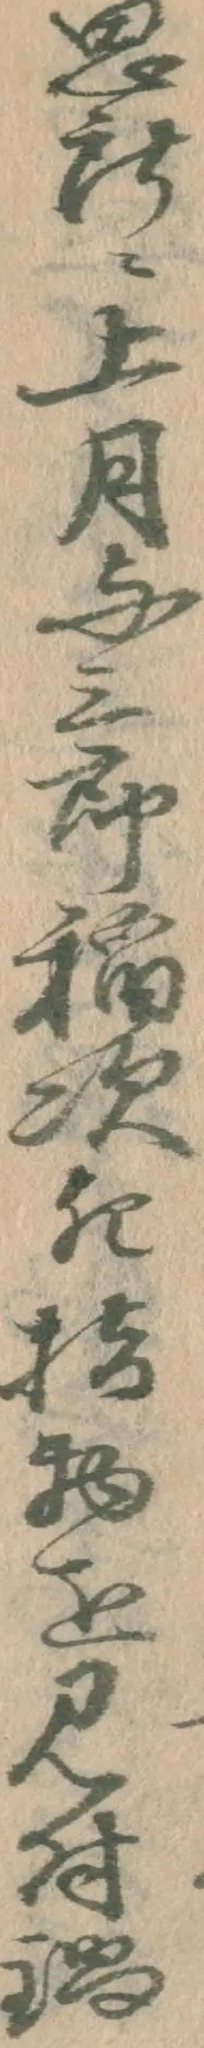思所に上月与三郎稲次歟指物を見付鍋
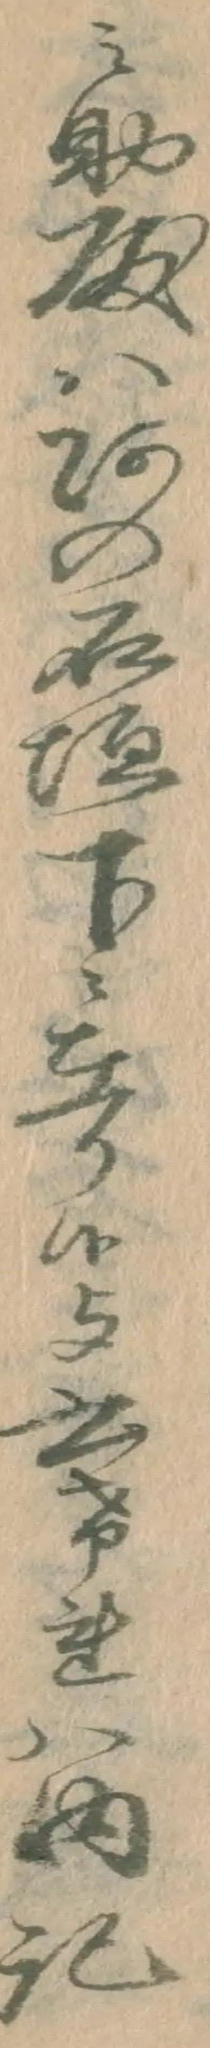之助殿は阿の石垣下に在り候与云希連は内記
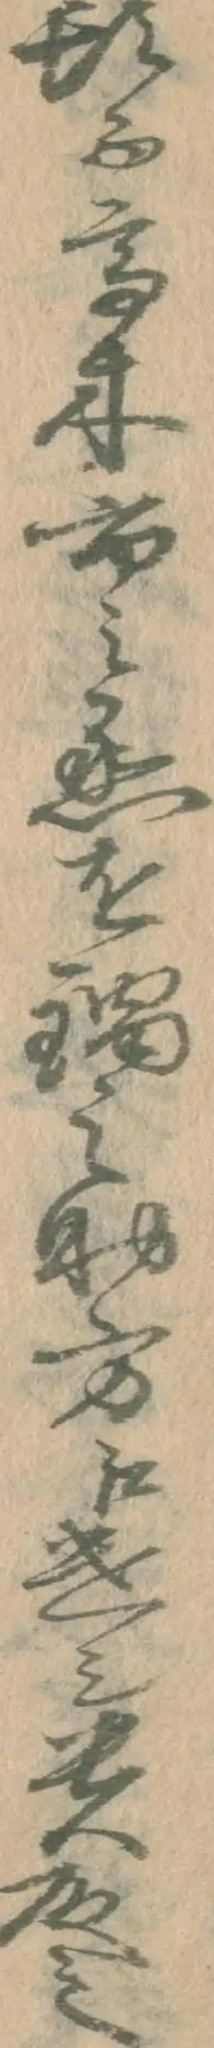頓而高木市之丞を鍋之助方江遣し貴殿之
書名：切支丹御退治記 49巻. [8]
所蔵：国立国会図書館 National Diet Library, JAPAN
